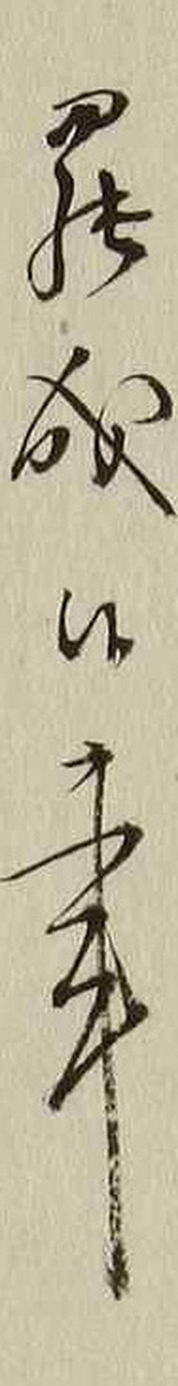罷成候事
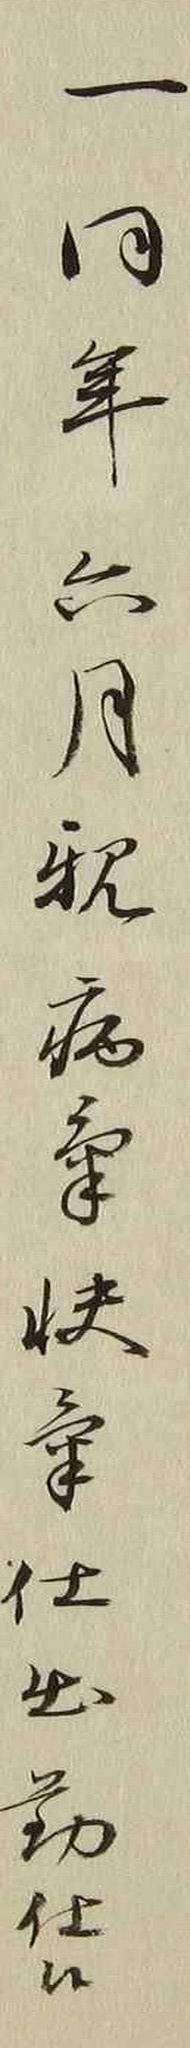一同年六月親病気快気仕出勤仕候
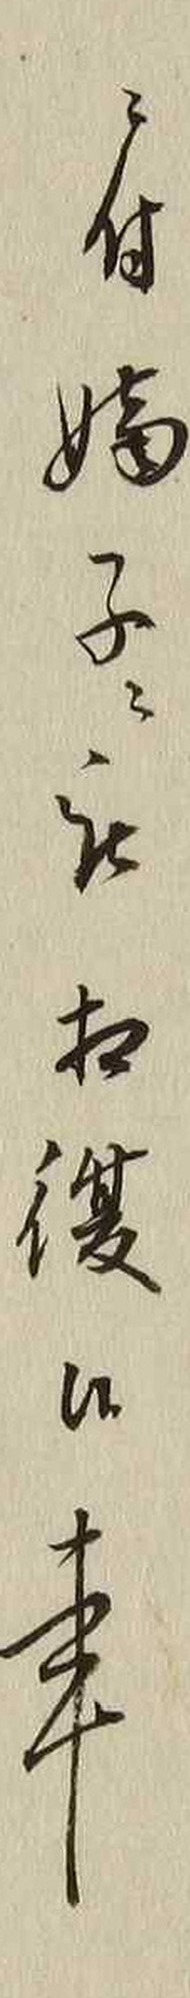ニ付嫡子ニ被相復候事
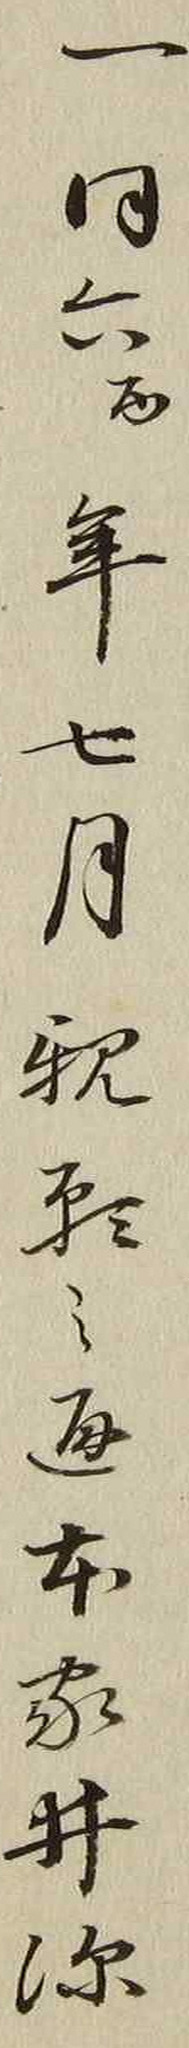一同六酉年七月親願之通本家井深
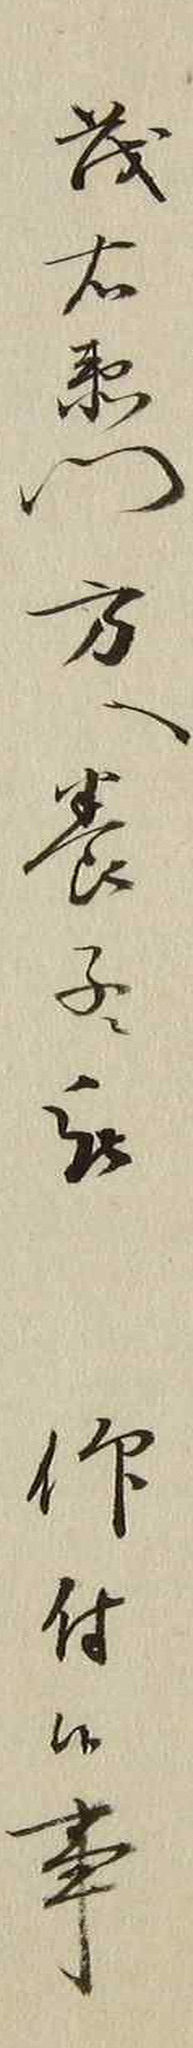茂右衛門方へ養子ニ被仰付候事
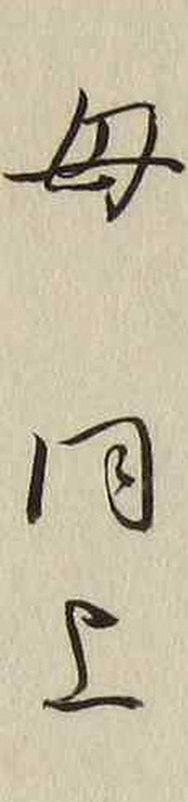母同上
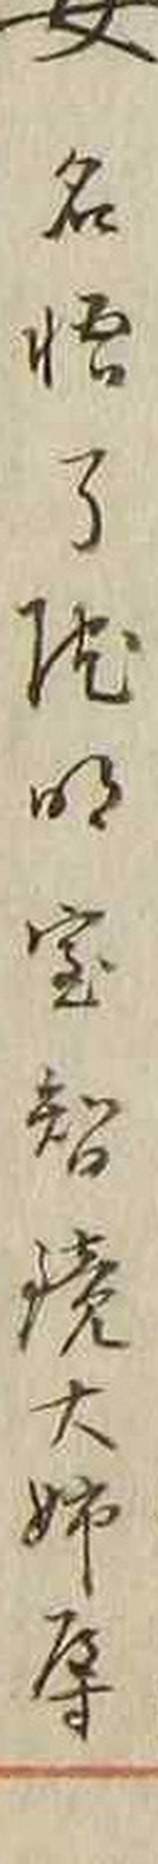名悟了院明宝智鏡大姉導
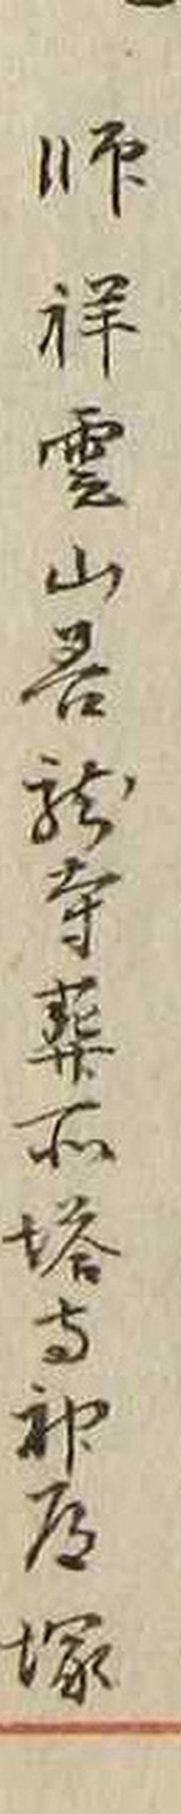師祥雲山善龍寺葬所塔寺神道塚

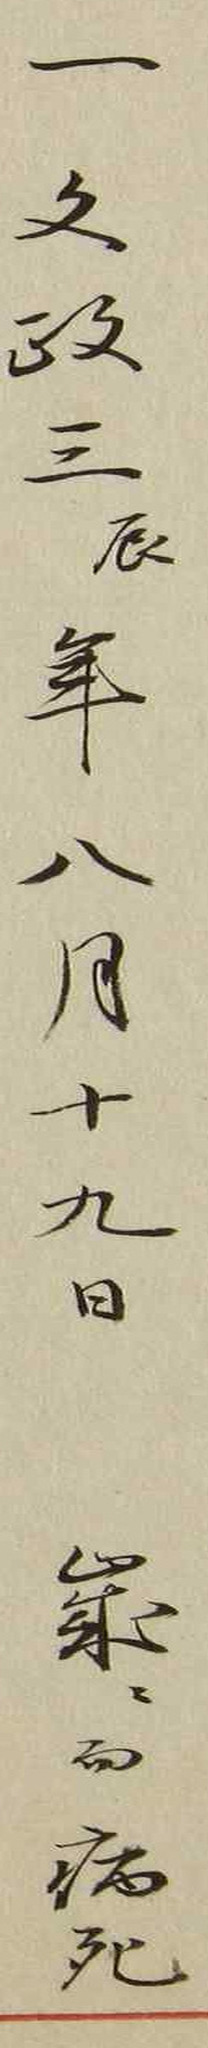一文政三辰年八月十九日歳ニ而病死
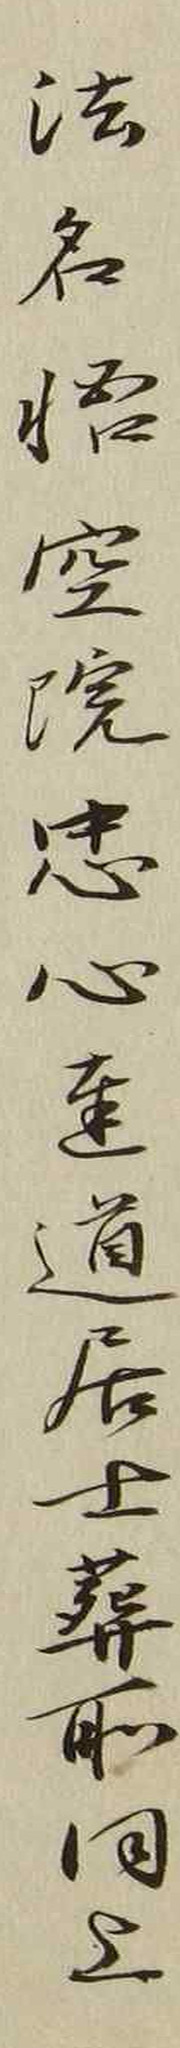法名悟空院忠心達道居士葬所同上
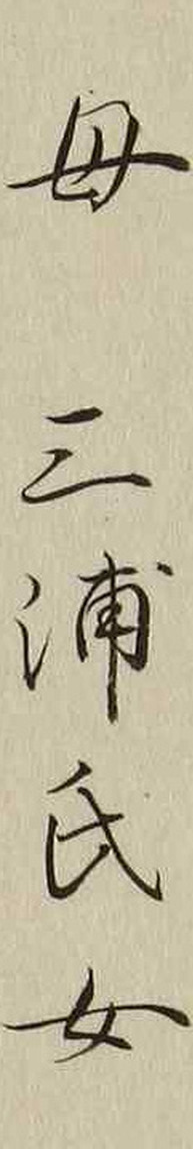母三浦氏女
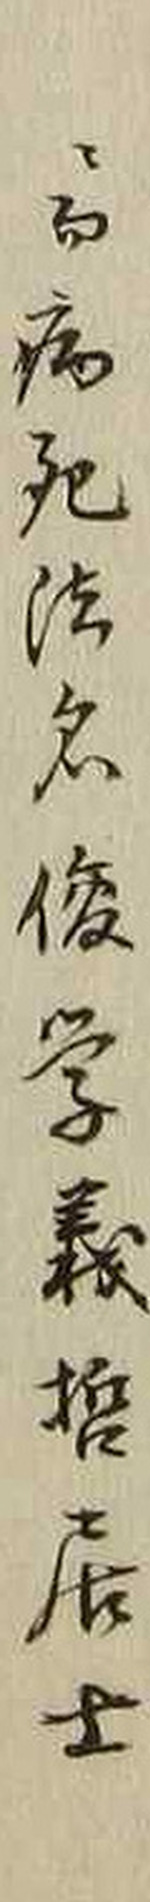ニ而病死法名俊学義哲居士
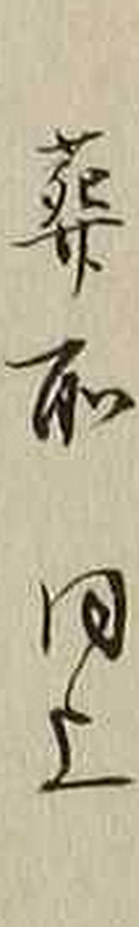葬所同上
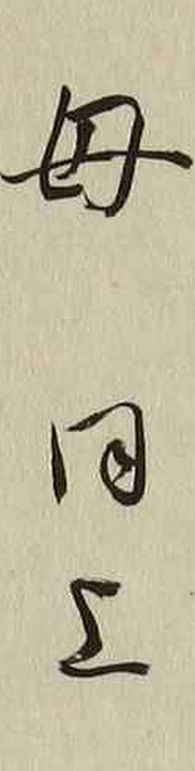母同上
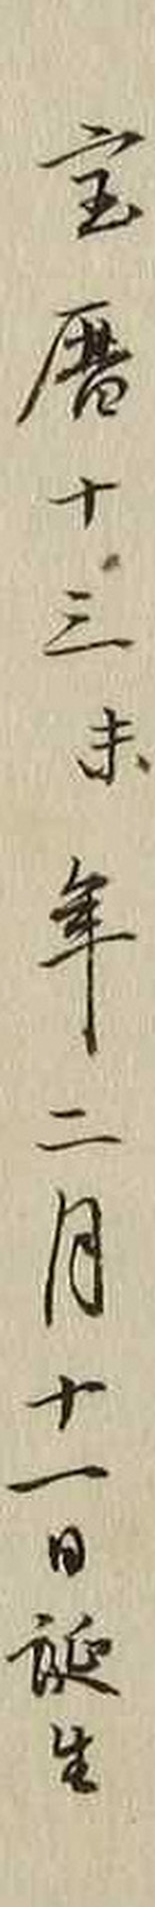宝暦十三未年二月十一日誕生
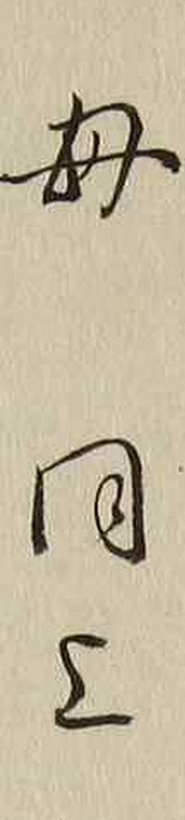母同上
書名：諸士系譜　巻之22　い之部22
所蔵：会津若松市立会津図書館
